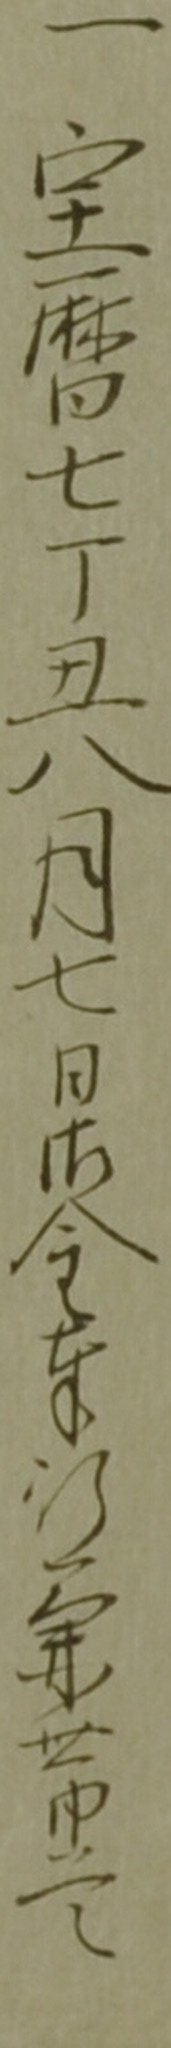一宝暦七丁丑八月七日御金奉行兼帯首
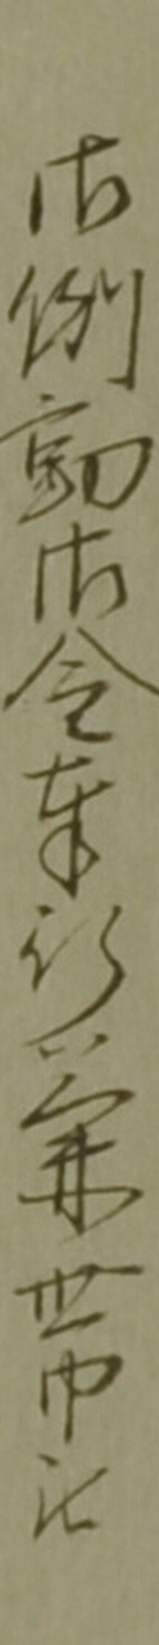御側勤御金奉行兼帯被
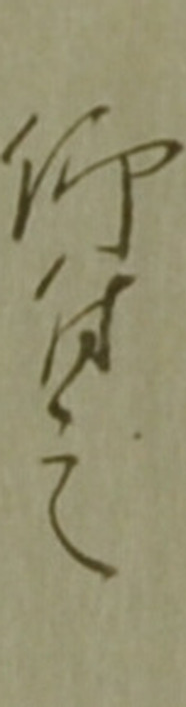仰付之
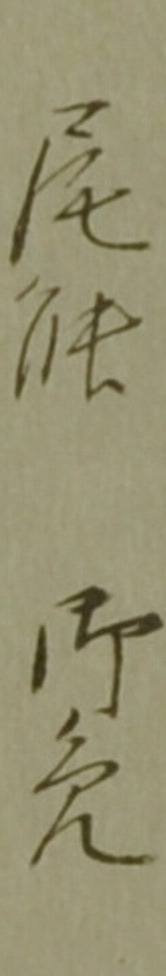尾能御免
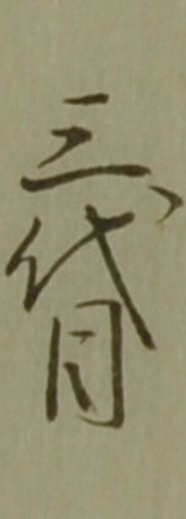三代目
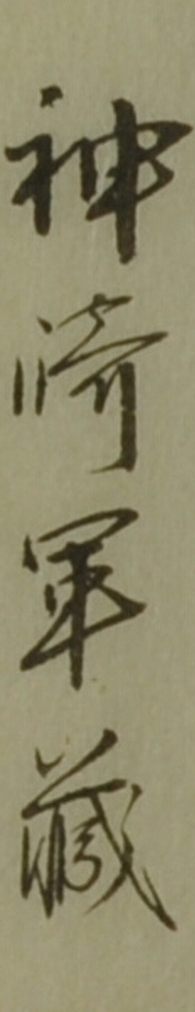神崎軍蔵
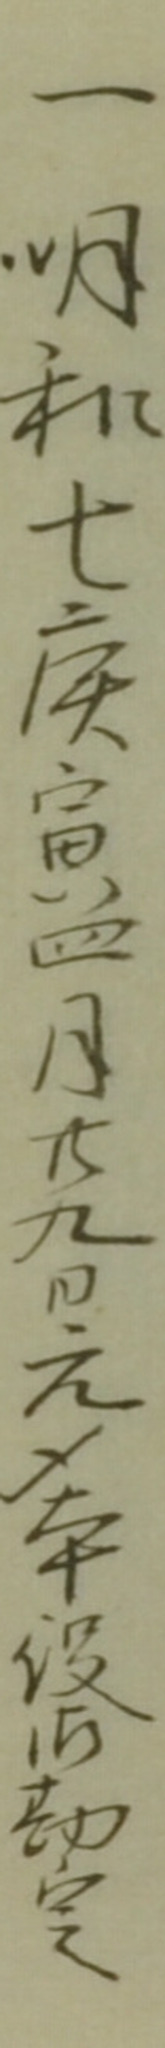一明和七庚寅四月廿九日元〆本役御勘定
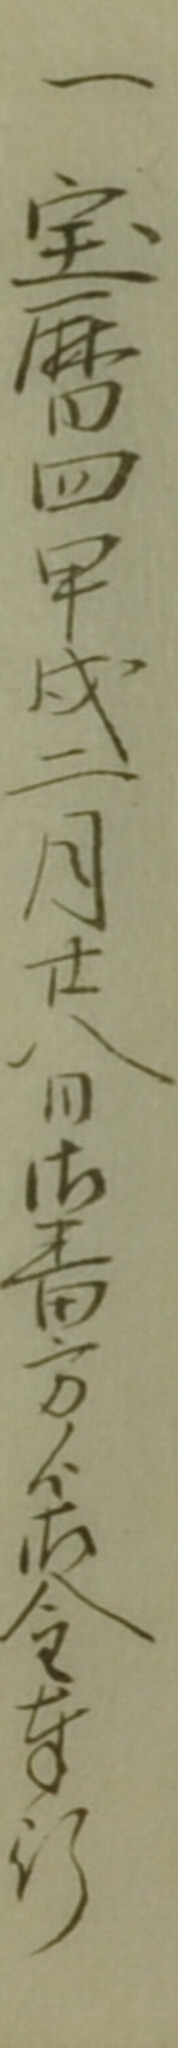一宝暦四甲戌二月二月廿八日御番方ゟ御金奉行
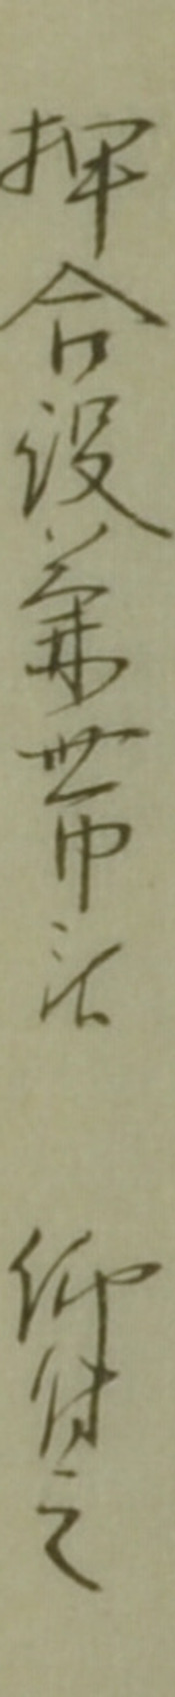押合役兼帯被仰付之
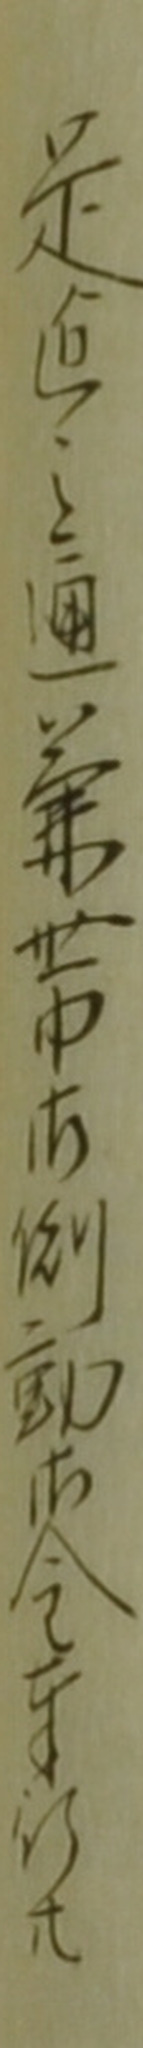是迄之通兼帯御側勤御金奉行共
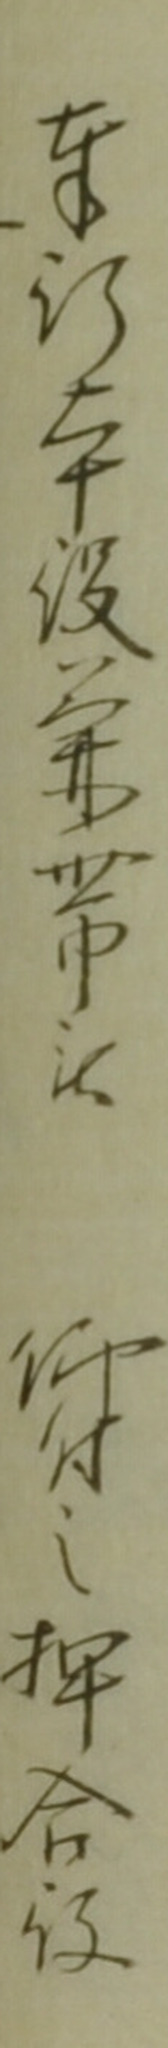奉行本役兼帯被仰付之押合役
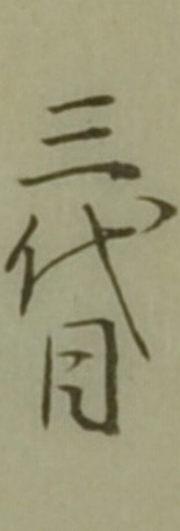三代目
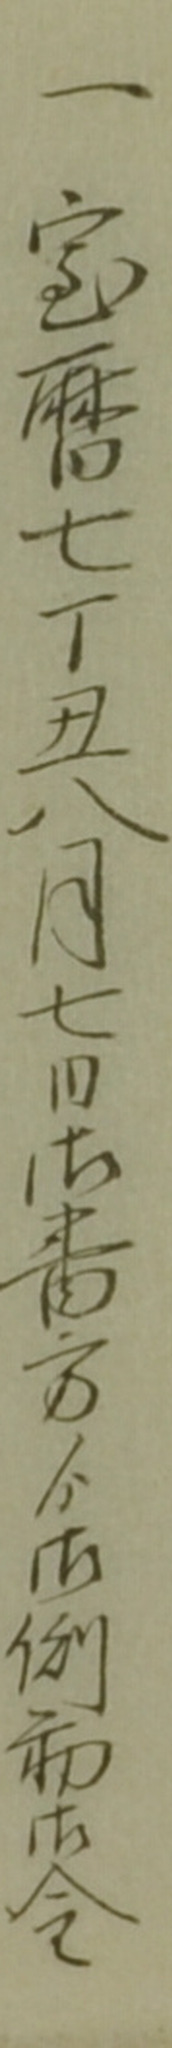一宝暦七丁丑八月七日御番方ゟ御側勤御金
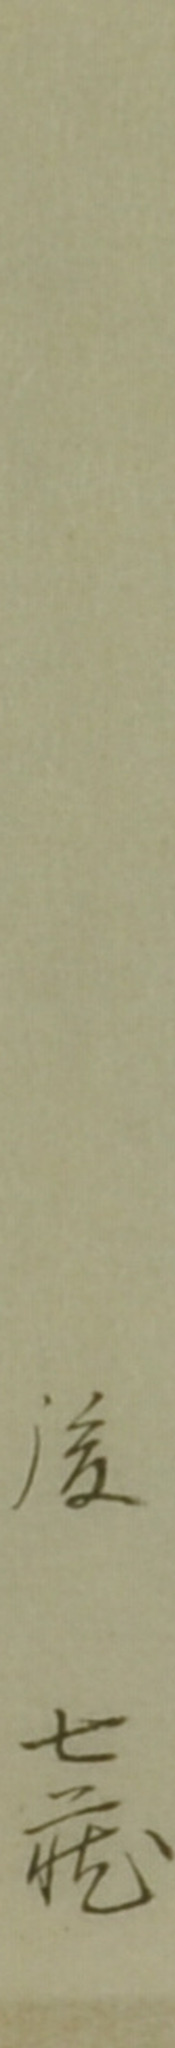後七蔵
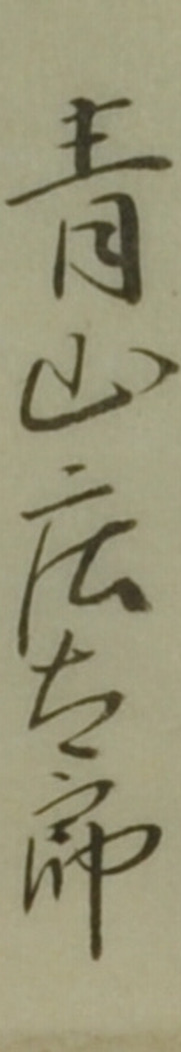青山庄太郎
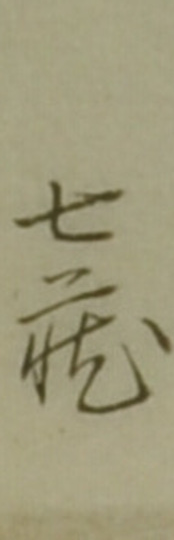後七蔵
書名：諸御役代々録（七）
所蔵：伊那市立高遠町図書館・合同会社AMANE
